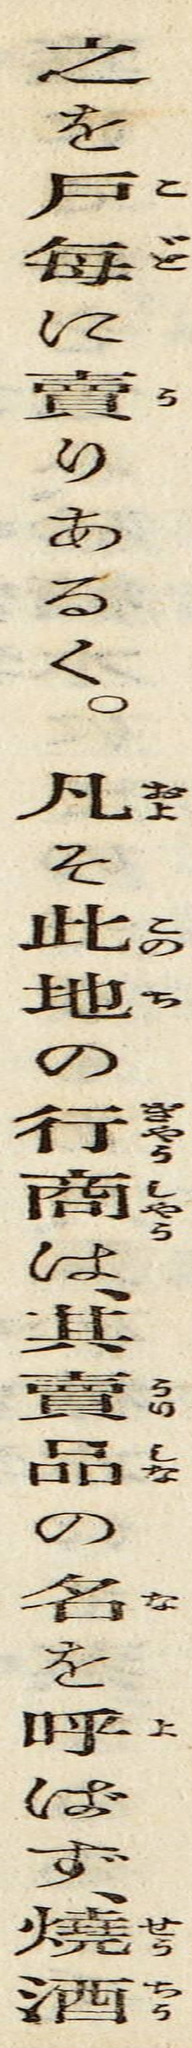之を戸毎に売りあるく。凡そ此地の行商は、其売品の名を呼ばず、焼酒
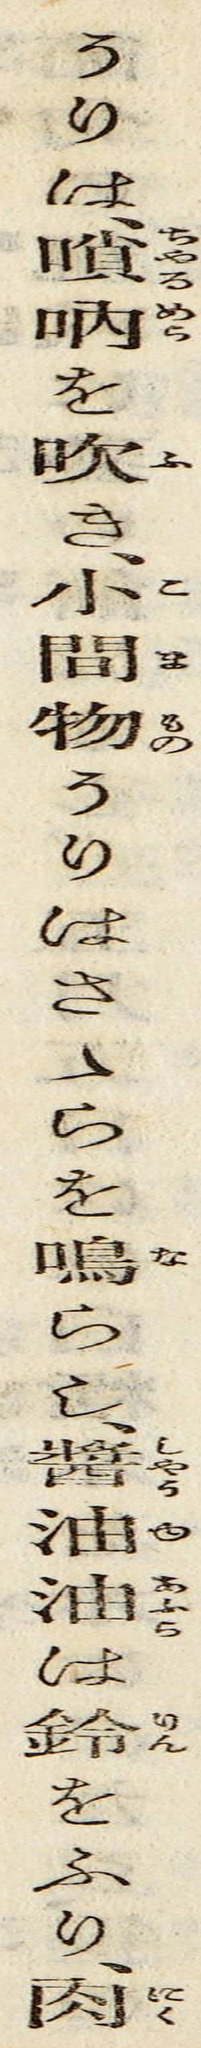うりは、嗩吶を吹き、小間物うりはさゝらを鳴らし、醤油油は鈴をふり、肉
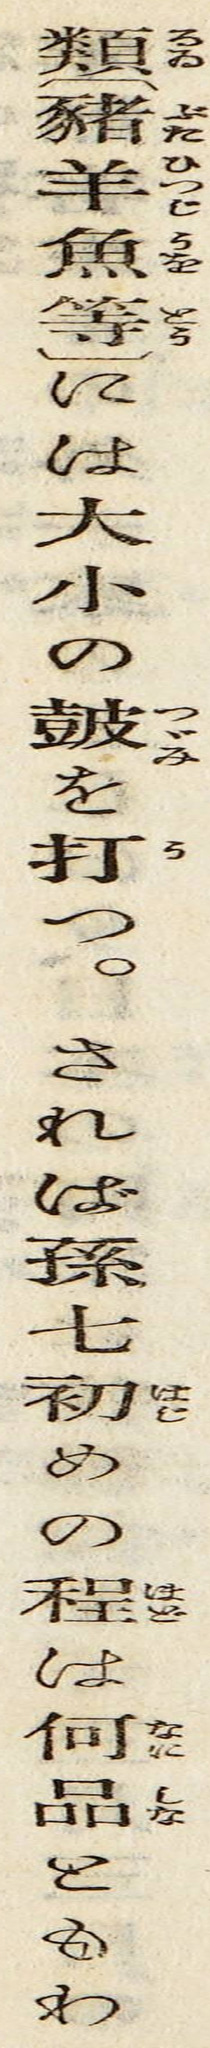類[猪羊魚等]には大小の鼓を打つ。されば孫七初めの程は何品ともわ
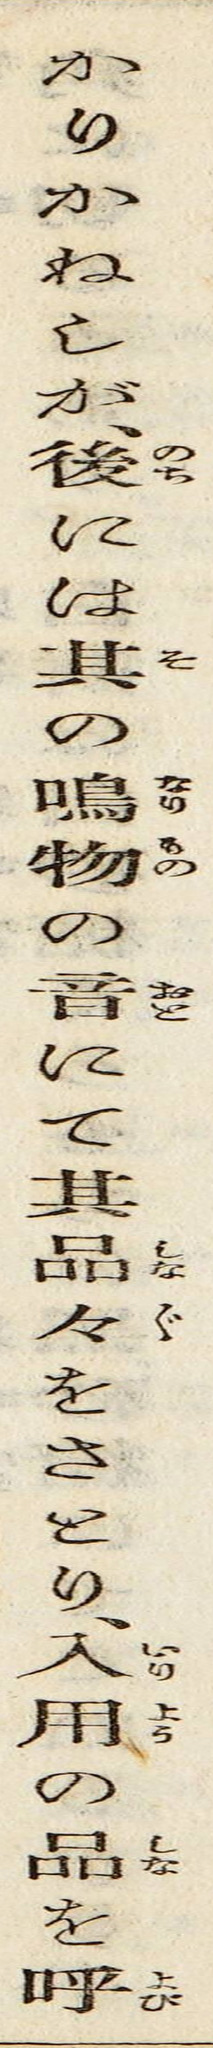かりかねしが、後には其の鳴物の音にて其品々をさとり、入用の品を呼
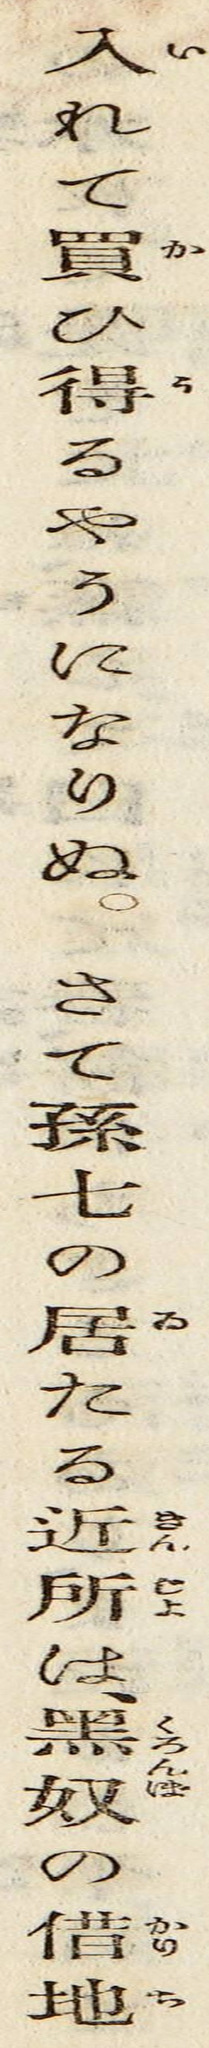入れて買ひ得るやうになりぬ。さて孫七の居たる近所は、黒奴の借地
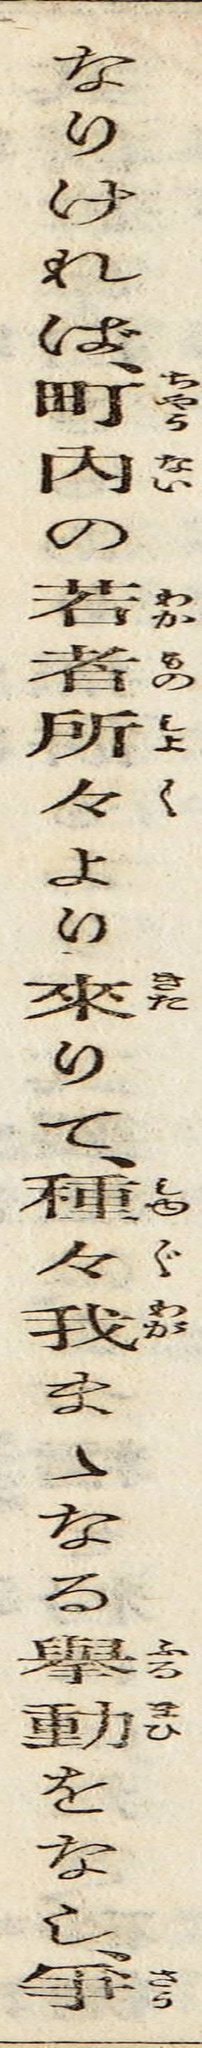なりければ、町内の若者所々より来りて、種々我まゝなる挙動をなし、争
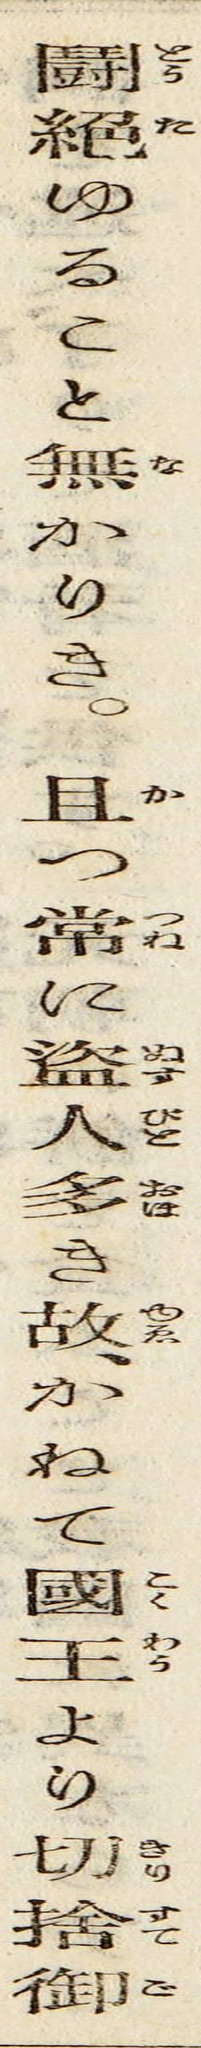闘絶ゆること無かりき。且つ常に盗人多き故、かねて国王より切捨御
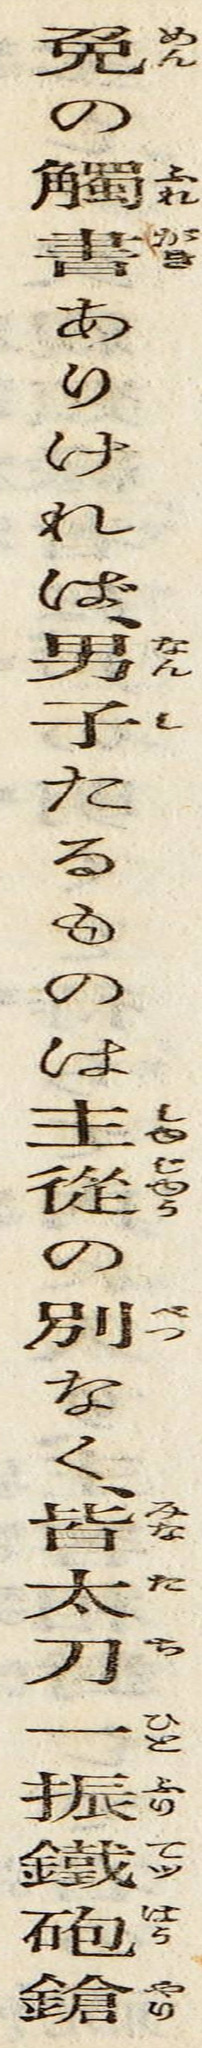免の触書ありければ、男子たるものは主従の別なく、皆太刀一振鉄砲鎗
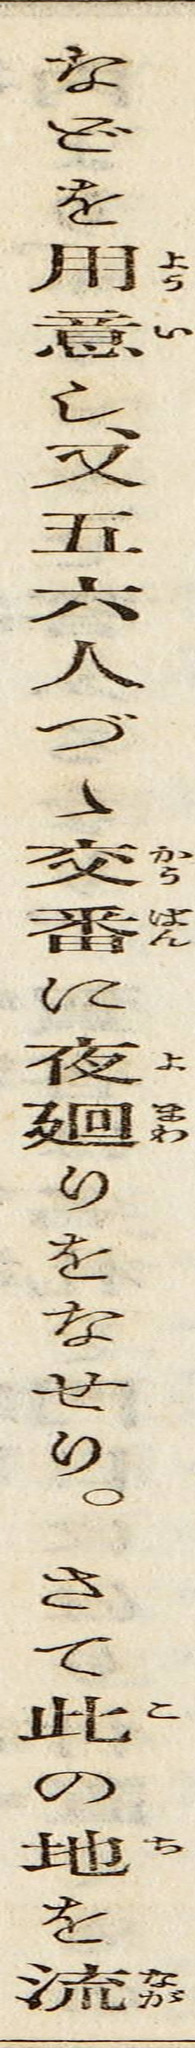などを用意し、又五六人づゝ交番に夜廻りをなせり。さて此の地を流
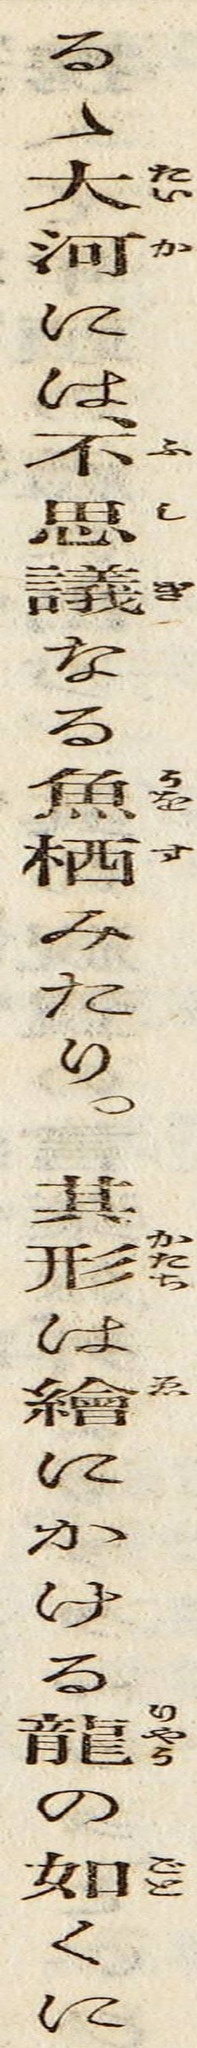るゝ大河には、不思議なる魚栖みたり。其形は絵にかける竜の如くに
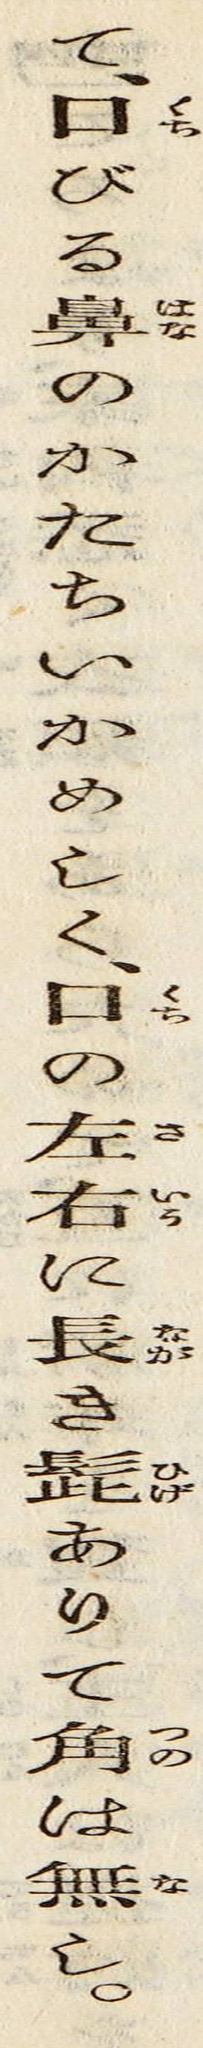て、口びる鼻のかたちいかめしく、口の左右に長き鬚ありて角は無し。
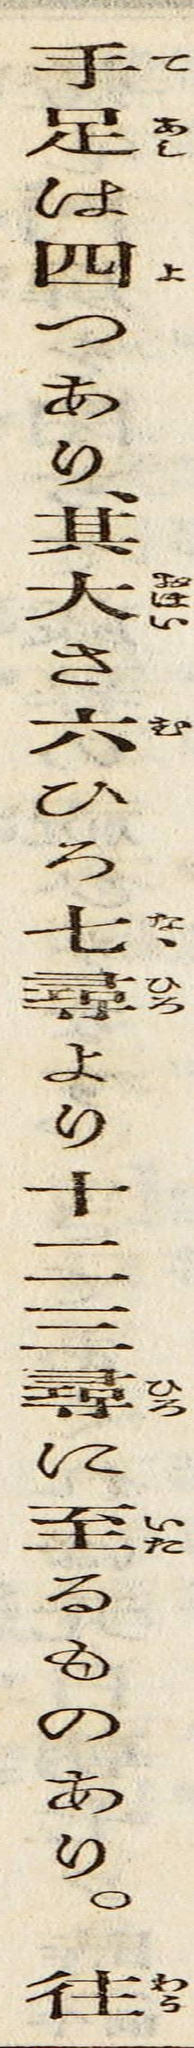手足は四つあり、其大さ六ひろ七尋より十二三尋に至るものあり。往
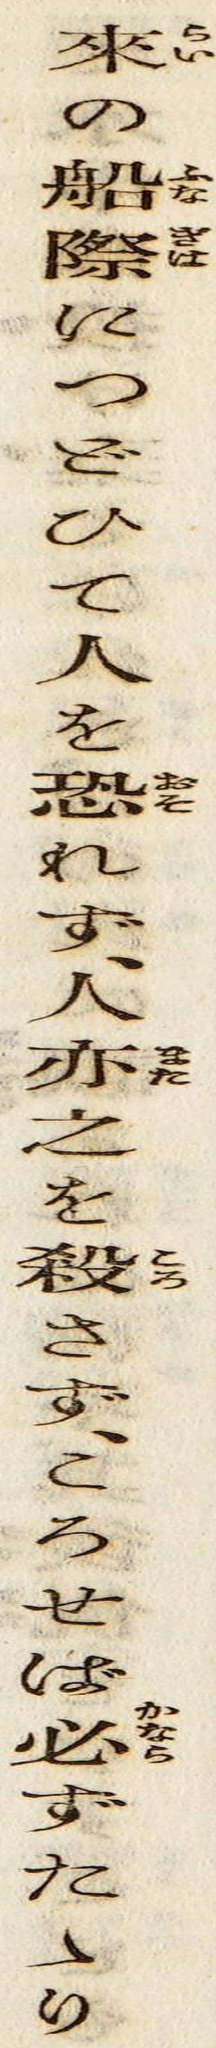来の船際につどひて人を恐れず、人亦之を殺さず、ころせば必ずたゝり
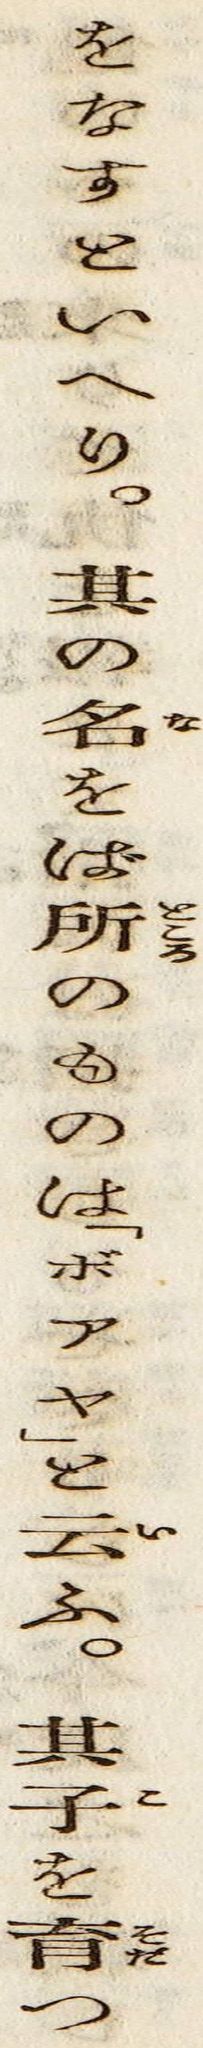をなすといへり。其の名をば所のものは「ボアヤ」と云ふ。其子を育つ
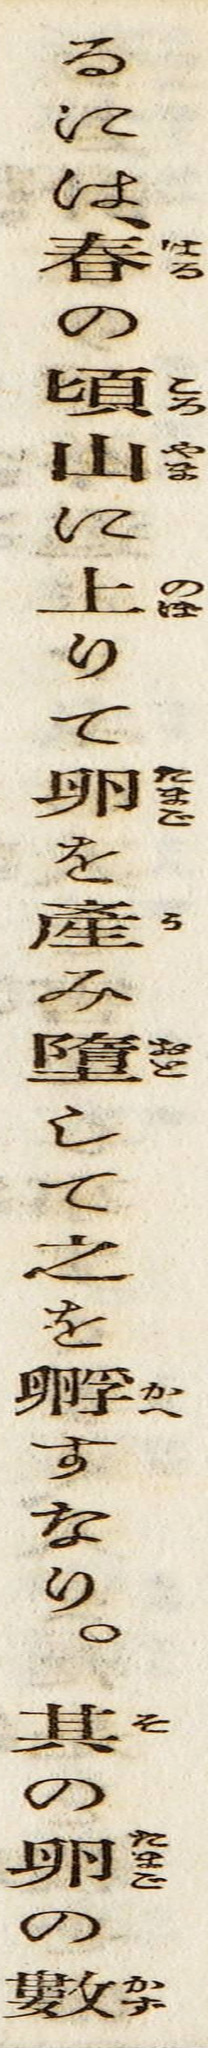るには、春の頃山に上りて卵を産み堕して之を孵すなり。其の卵の数
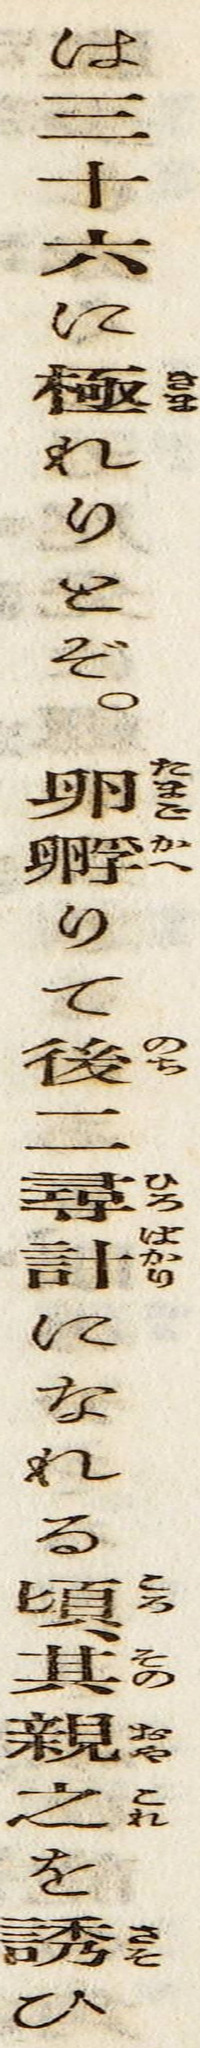は三十六に極れりとぞ。卵孵りて後二尋計になれる頃、其親之を誘ひ
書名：日本漂流譚
